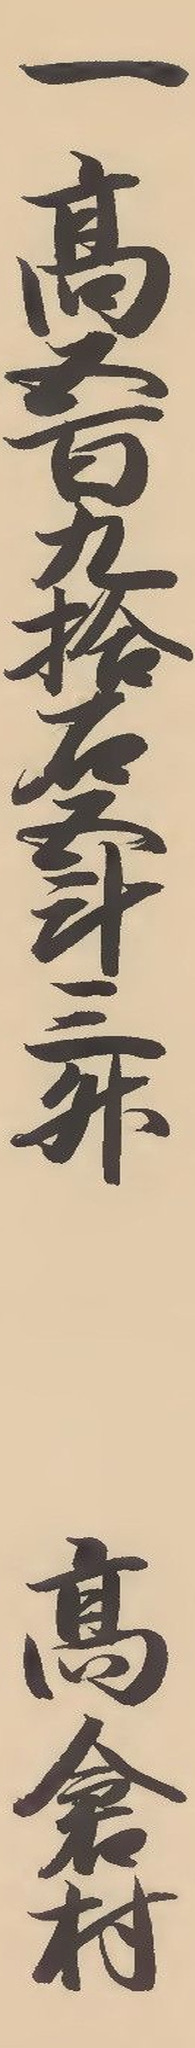一高五百九拾石五斗三升高倉村
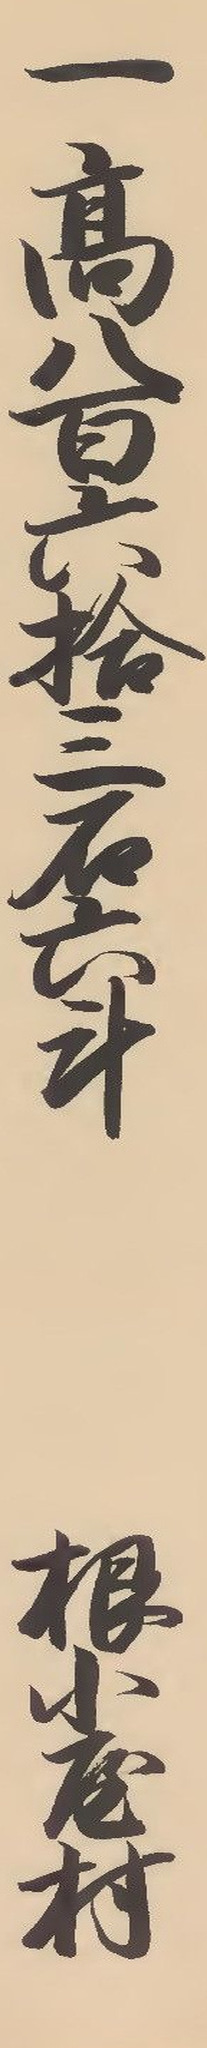一高八百六拾三石六斗根小屋村
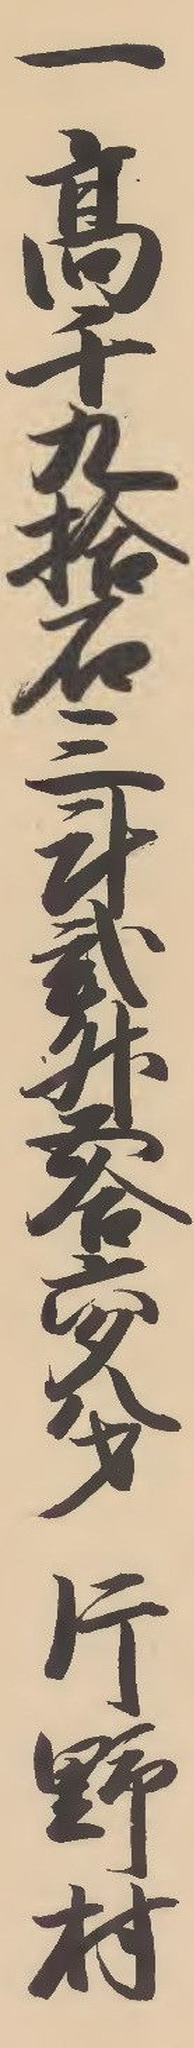一高千九拾石三斗弐升五合六勺八才片野村

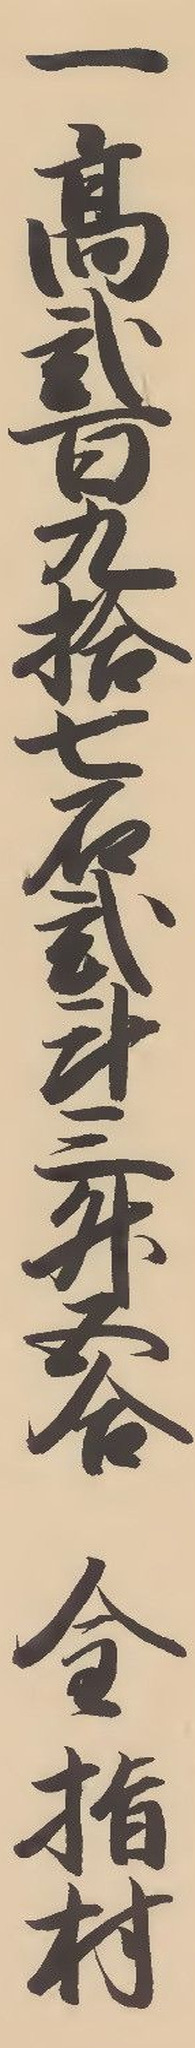一高弐百九拾七石弐斗三升五合金指村
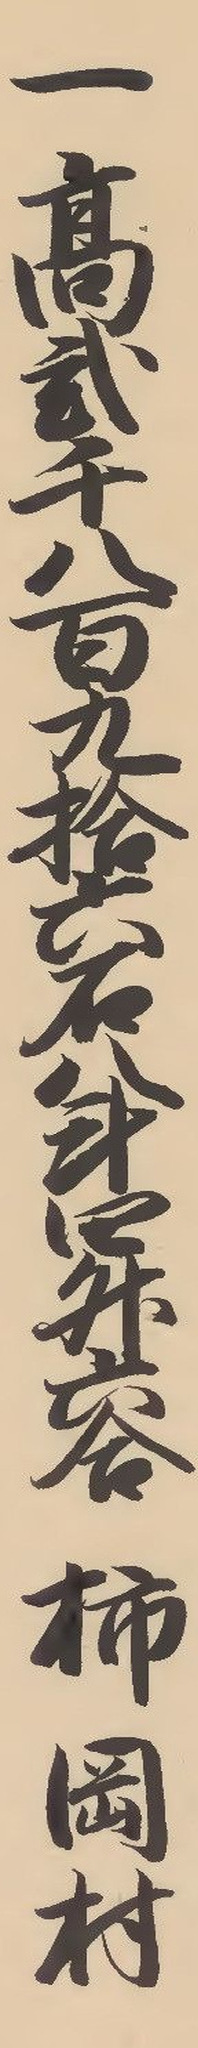一高弐千八百九拾六石八斗四升六合柿岡村
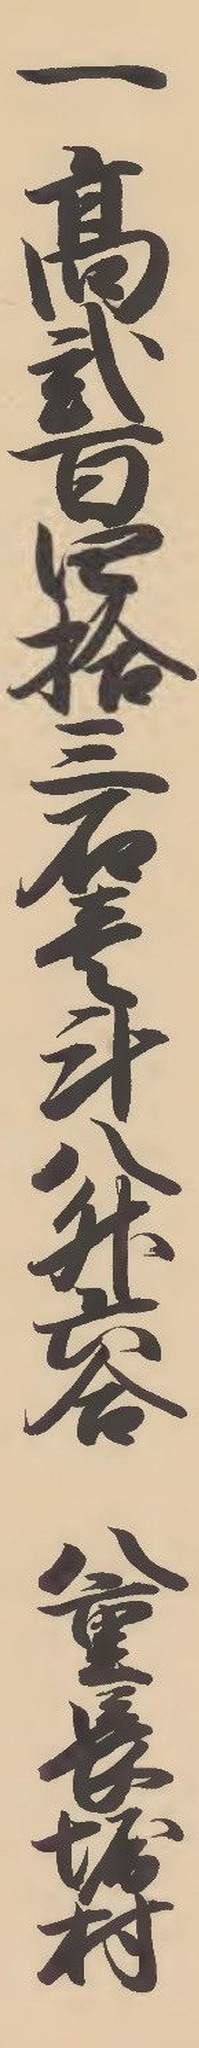一高弐百四拾三石壱斗八升六合八重長堀村
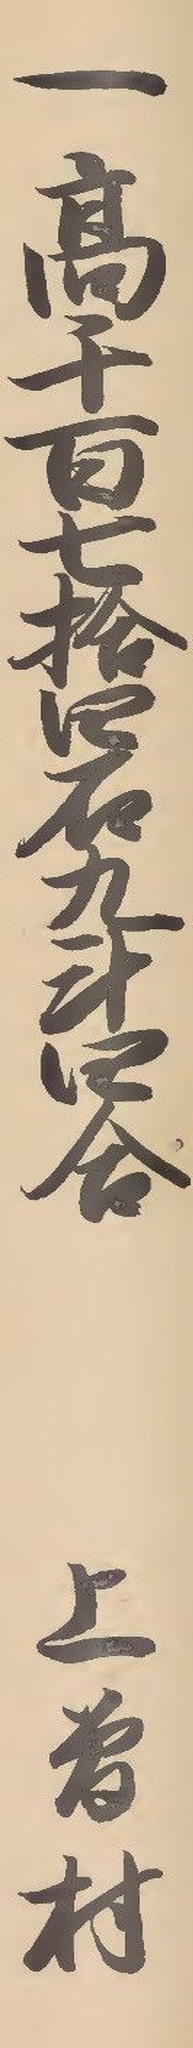一高千百七拾四石九斗四合上曽村
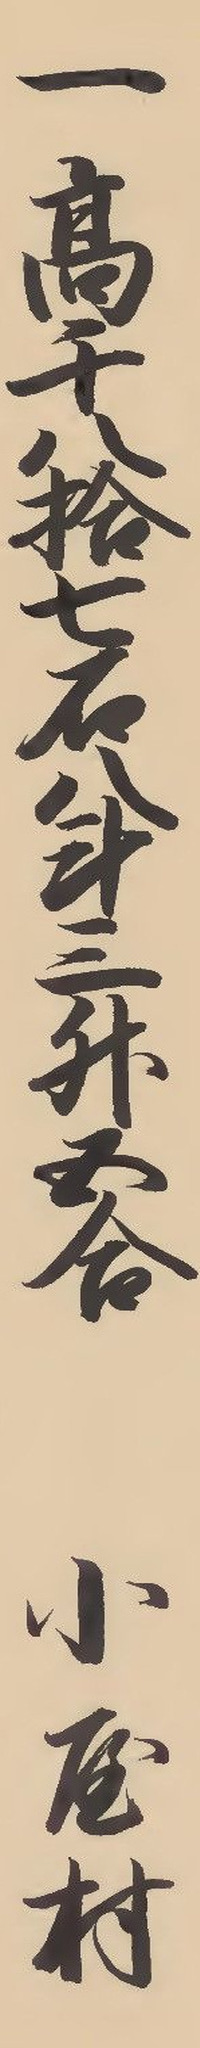一高千八拾七石八斗三升五合小屋村
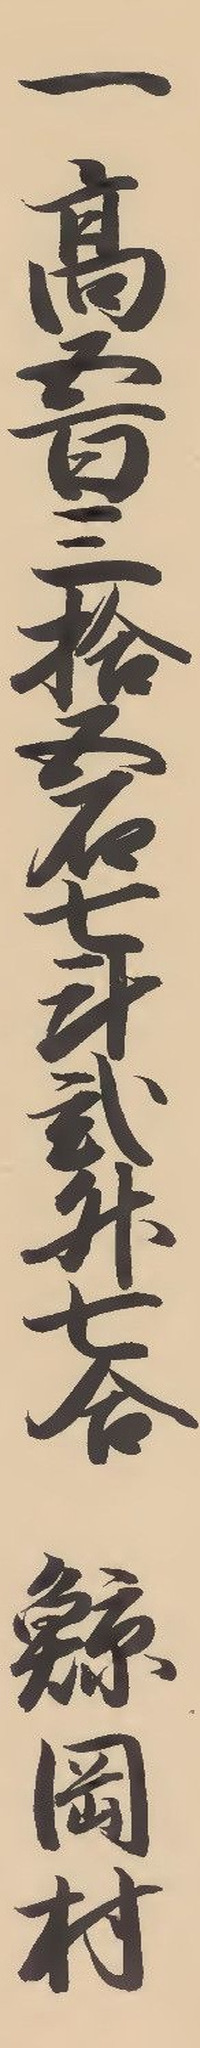一高五百三拾五石七斗弐升七合鯨岡村
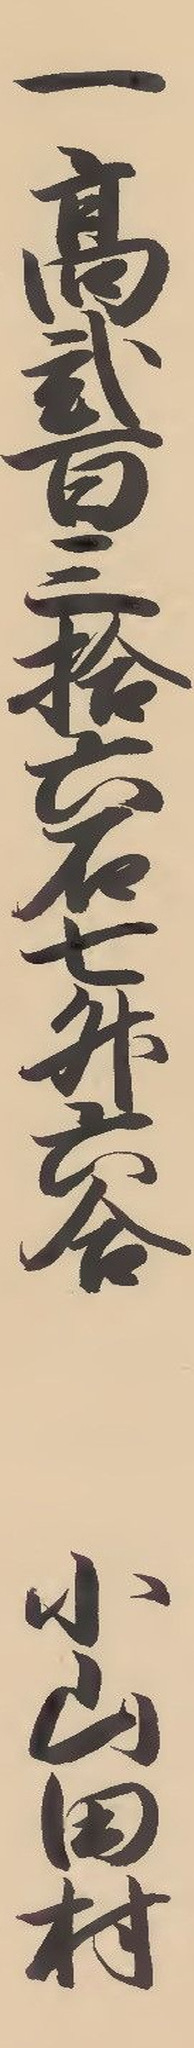一高弐百三拾六石七升六合小山田村

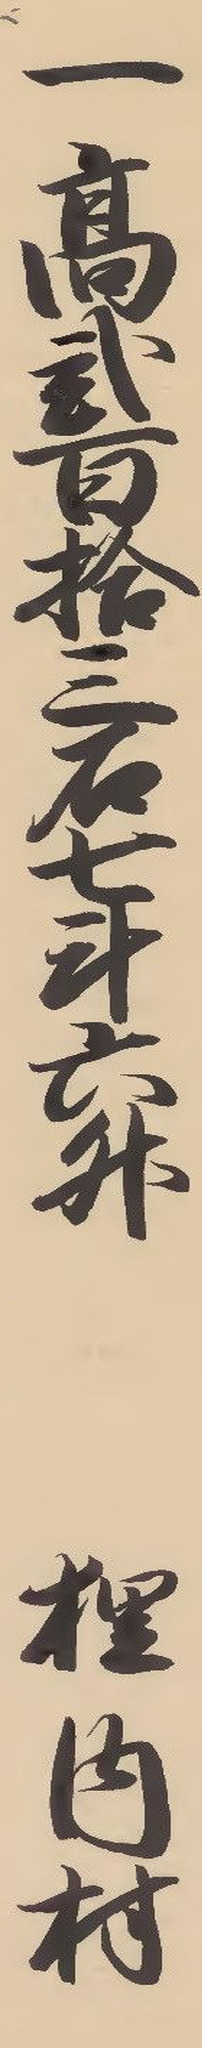一高弐百拾三石七斗六升狸内村
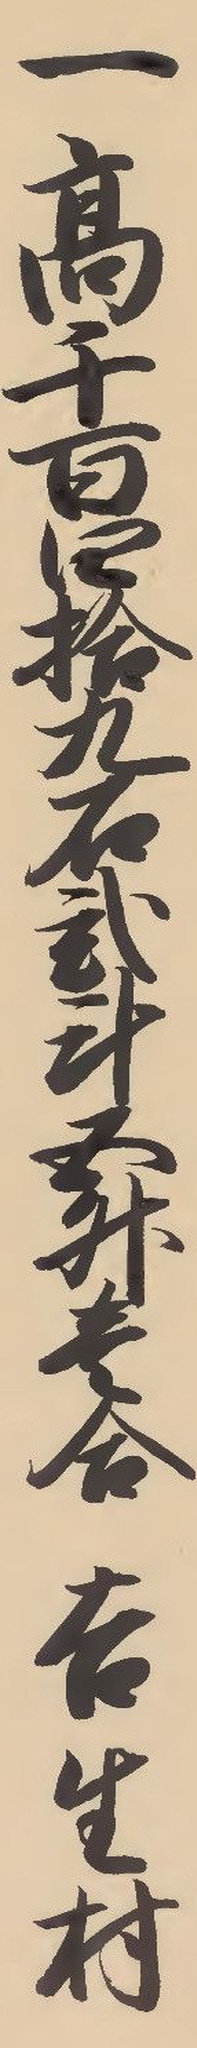一高千百四拾九石弐斗五升壱合吉生村
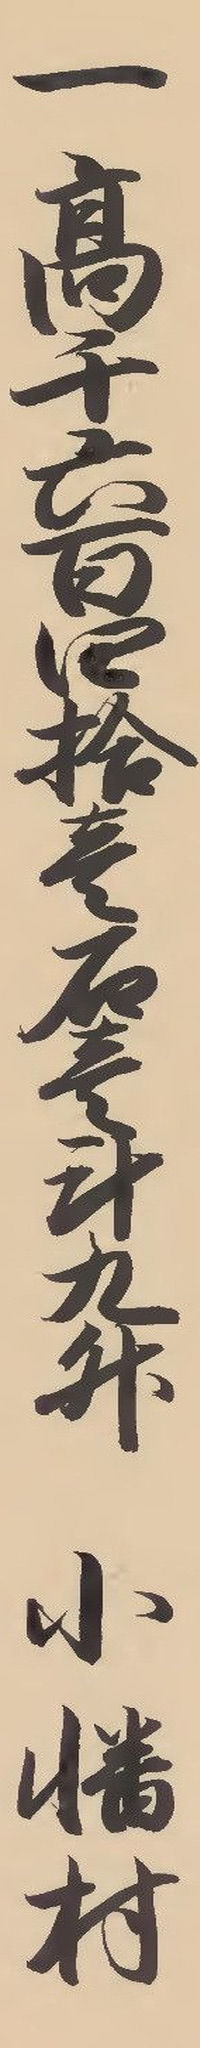一高千六百四拾壱石壱斗九升小幡村
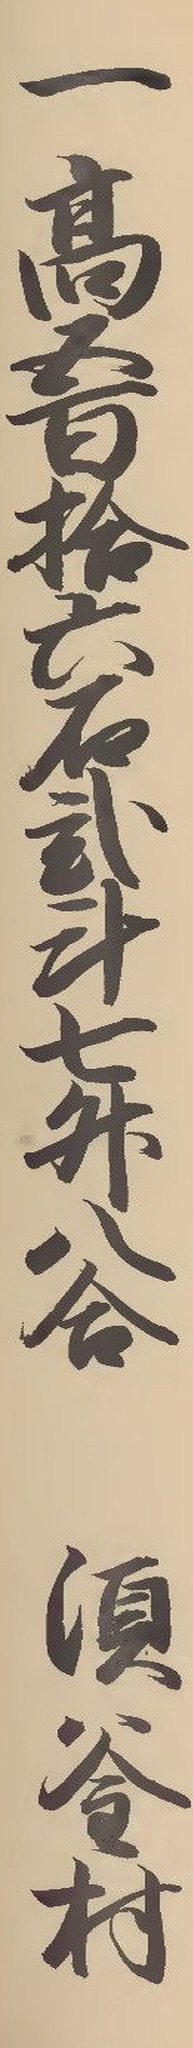一高五百拾六石弐斗七升八合須釜村
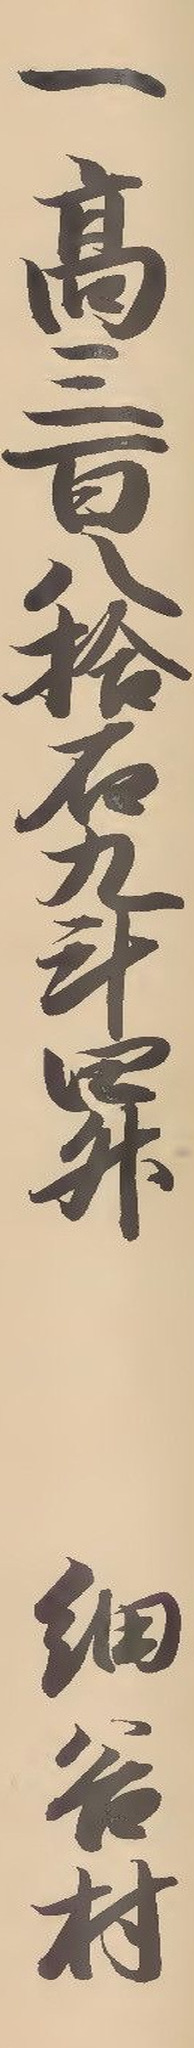一高三百八拾石九斗四升細谷村
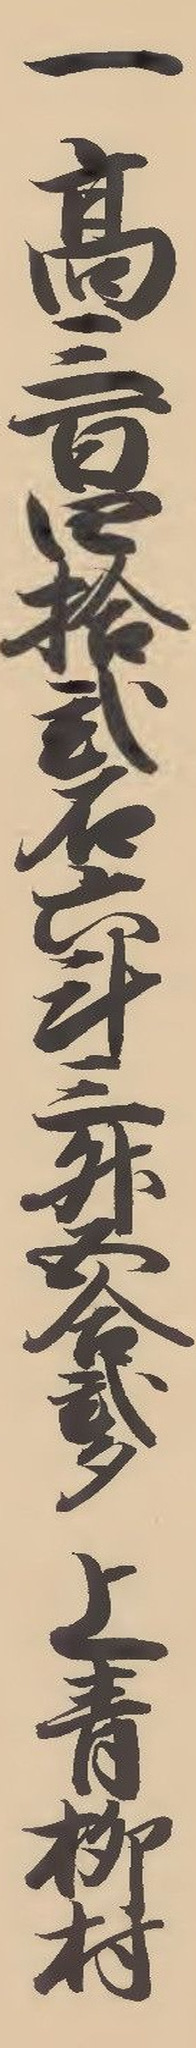一高三百四拾弐石六斗三升五合弐勺上青柳村
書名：常陸国郷帳
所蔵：国立公文書館 National Archives of Japan
